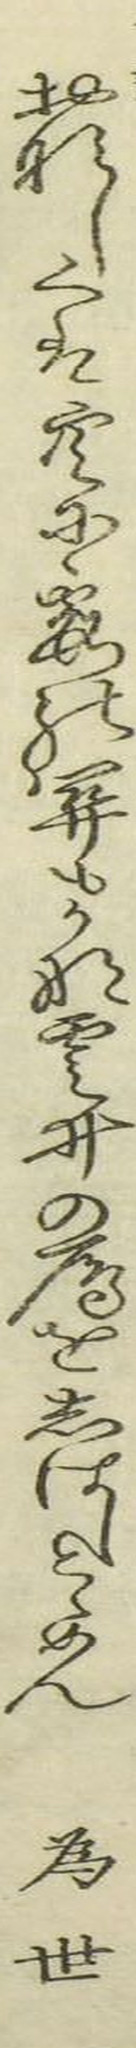おなしくは空に霞の關もかな雲井の鳫をしはしとゝめん為世
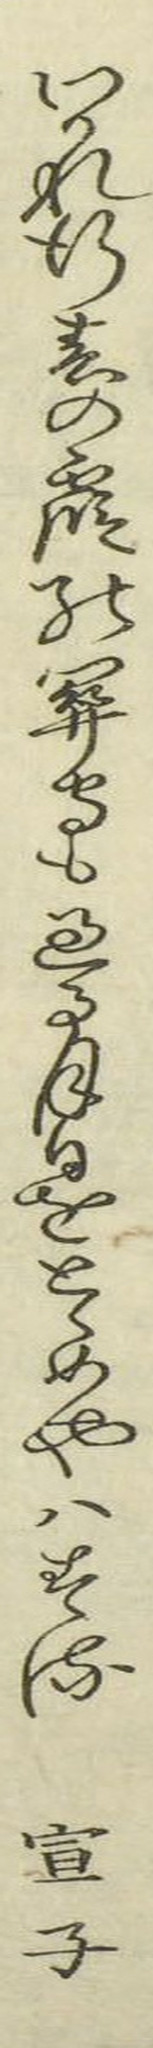わかれ行春の霞の關守も過る月日をとゝめやはする宣子
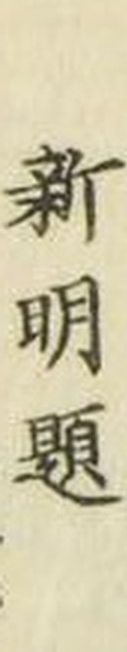新明題
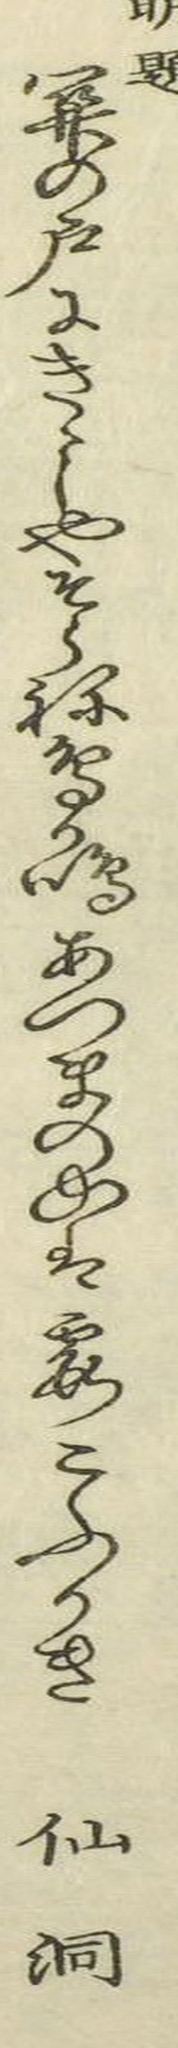關の戸にきゝしやそらね鳥か鳴あつまのよは霞こふりき仙洞
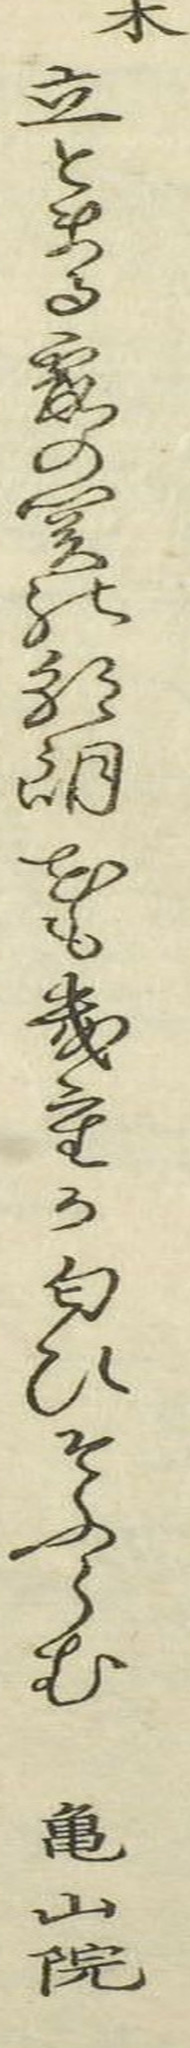立とまる霞の關の朝朗花も幾重か匂ひそふらむ亀山院
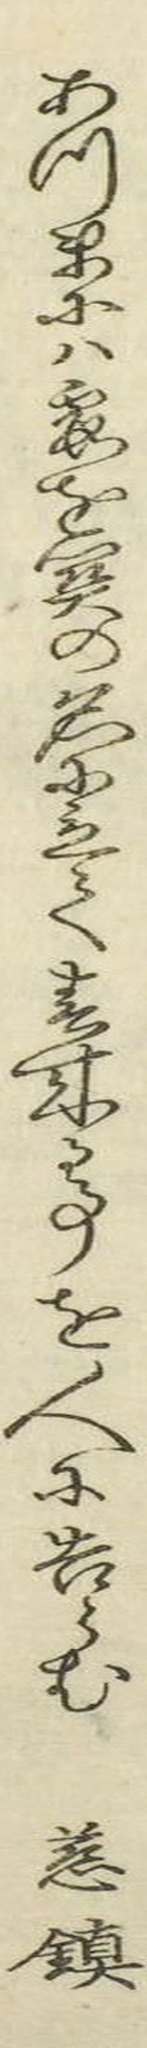あつまには霞を關の名に立て春来る事を人に告らむ慈鎮
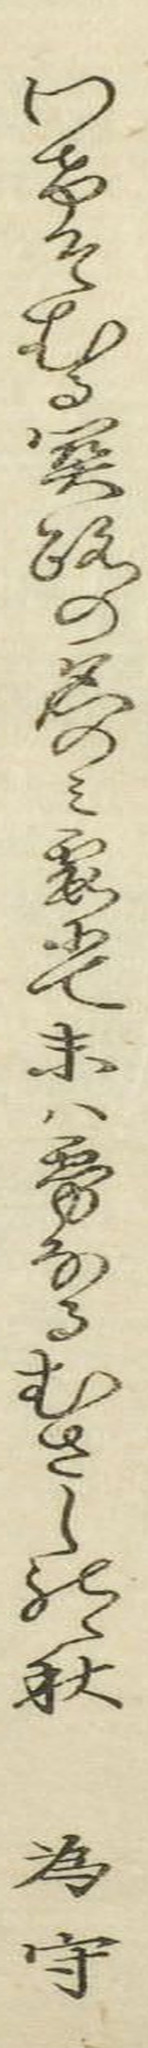わけそむる關路の名のみ霞にて末は霧なるむさしのゝ秋為守
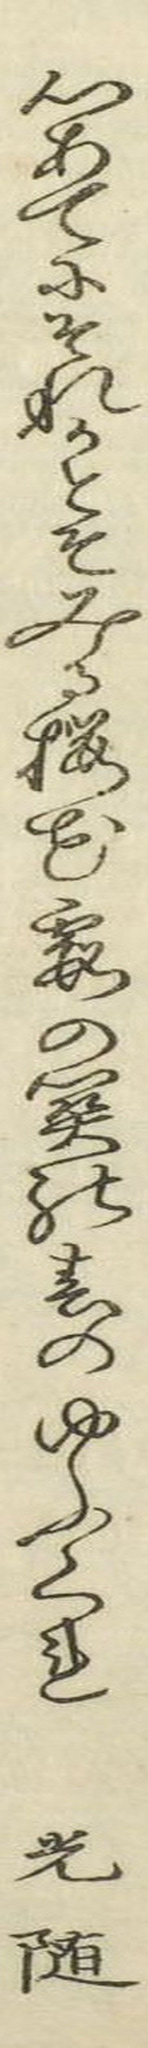心あてにそれかとそみる桜花霞の關の春のゆふくれ光随
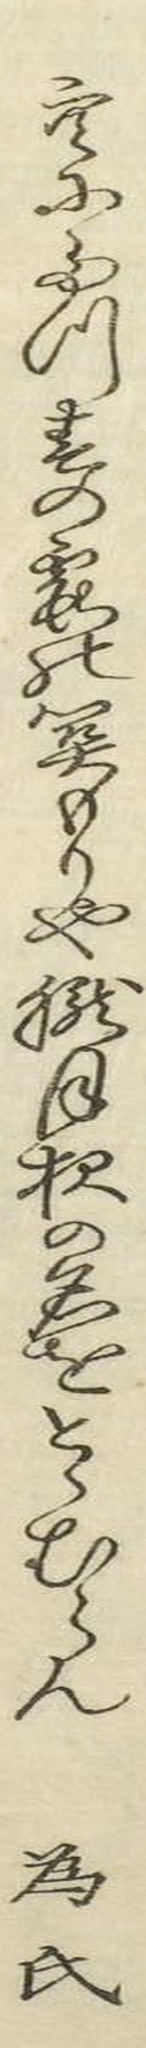空にたつ春の霞の關もりや朧月夜の名をとゝむらん為氏
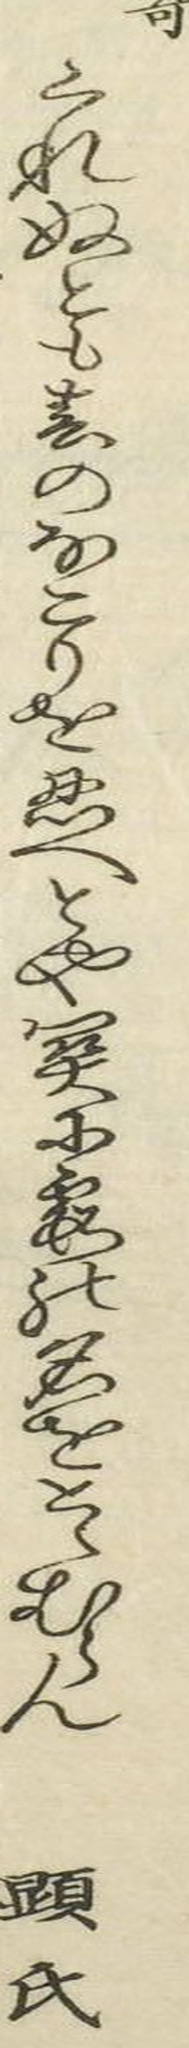くれぬとも春のなこりを忍へとや關に霞の名をとゝむらん顕氏
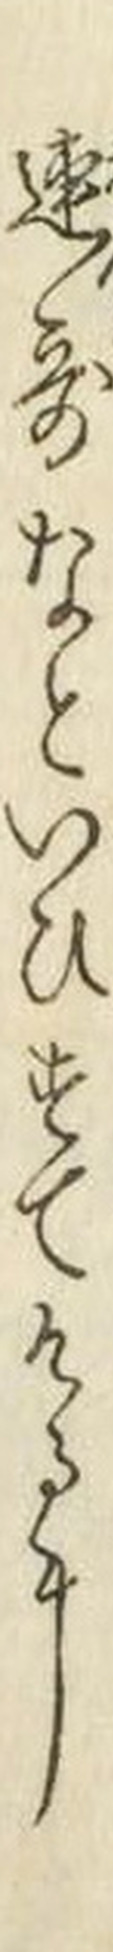連哥なといひすてけるに
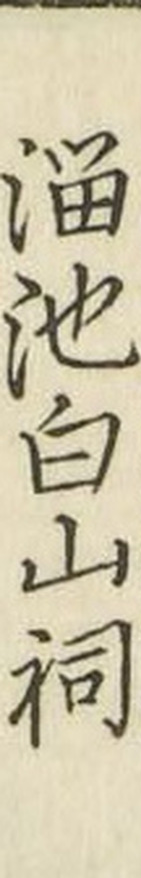溜池白山祠

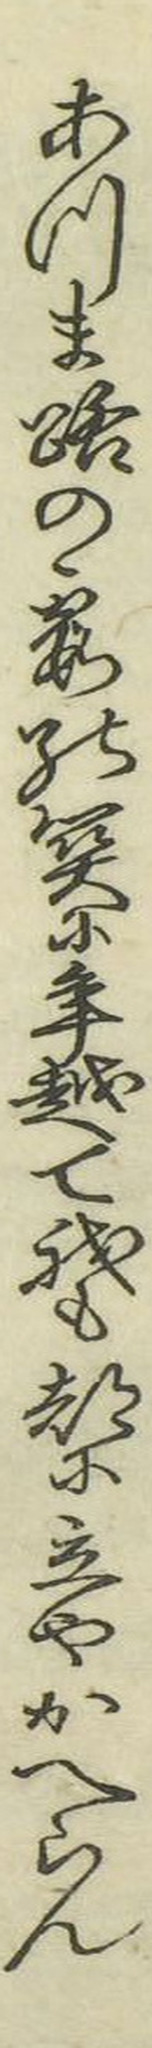あつま路の霞の關に年越て我も都に立やかへらん道奥准后
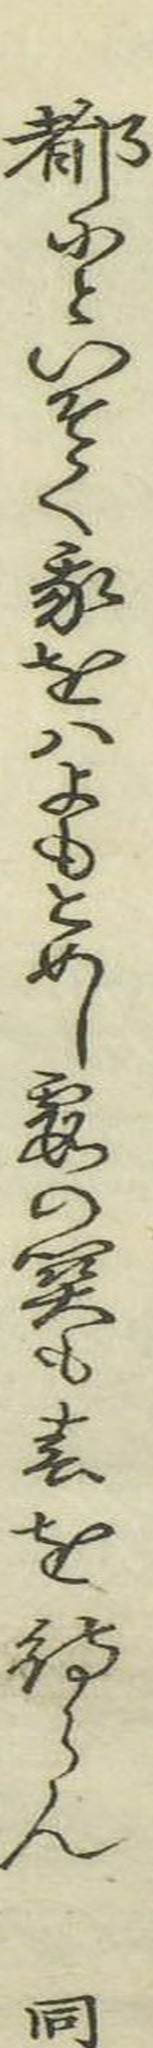都にといそく我をはよもとめし霞の関も春を待らん同
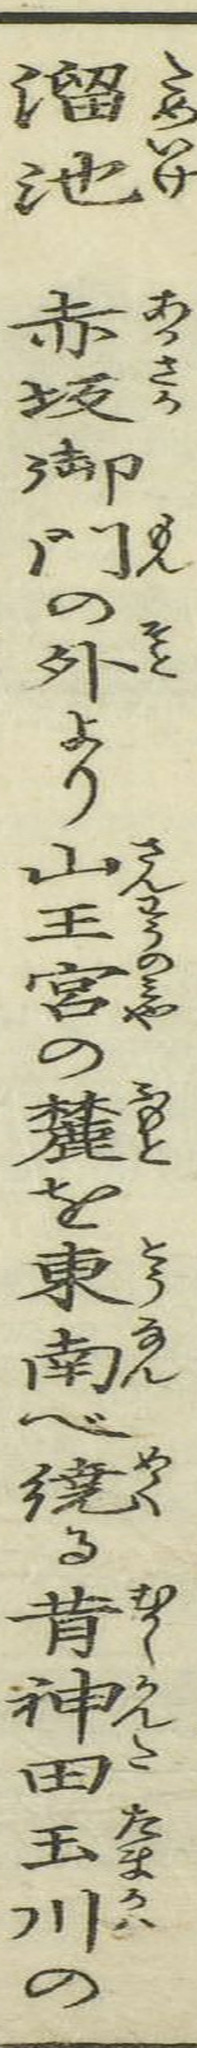溜池赤坂御門の外より山王宮の麓を東南へ繞る昔神田玉川の
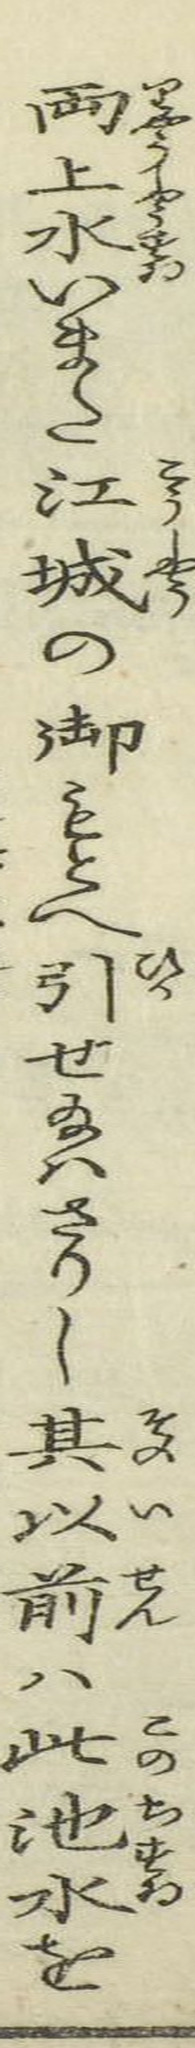両上水いまた江城の御もとへ引せ給はさりし其以前は此池水を
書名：江戸名所図会 20巻 巻之7
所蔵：東京学芸大学教育コンテンツアーカイブ
